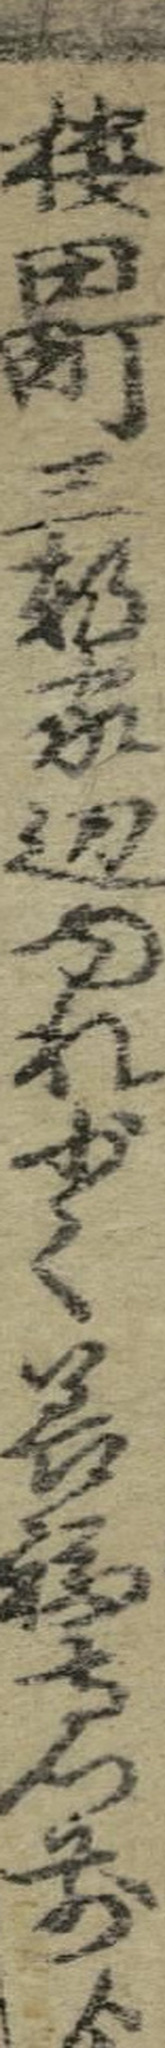桜田町三軒家辺ゆれ少く善福寺門前ゟ
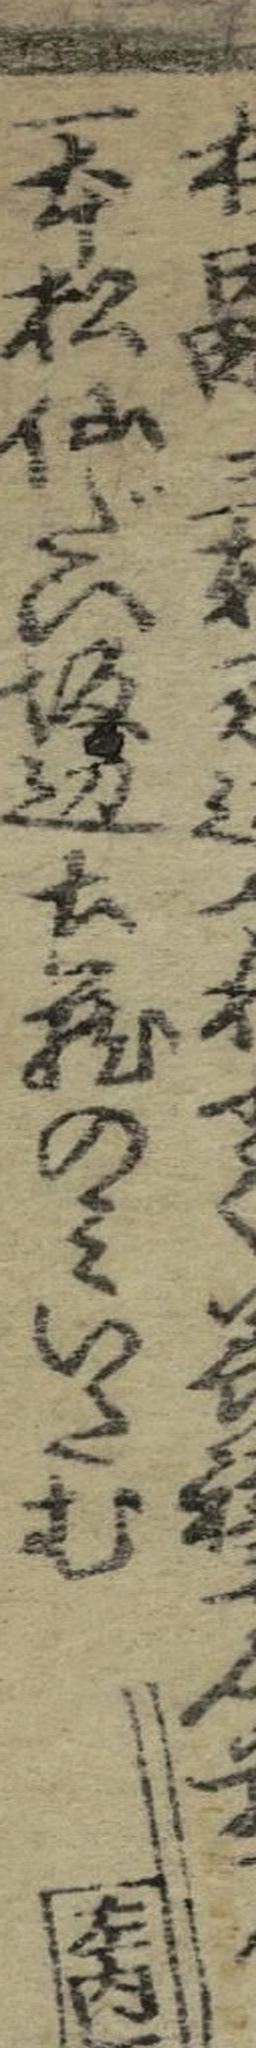一本松仙だい坂辺土蔵のみいたむ
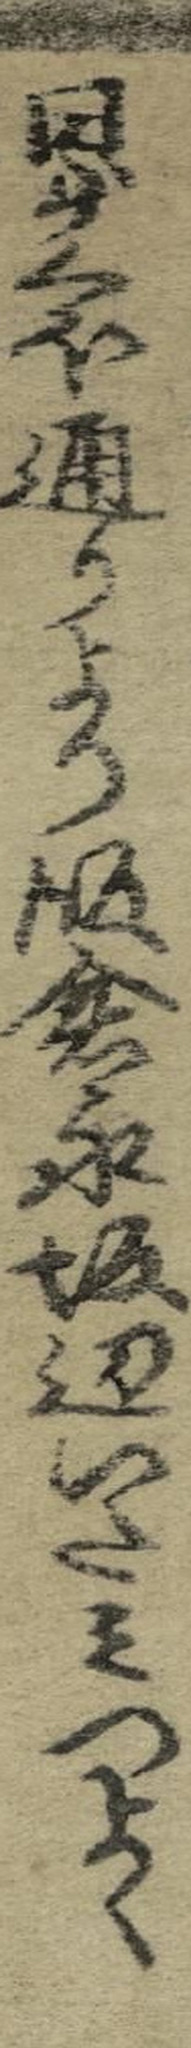日がくぼ通りより飯倉永坂辺いたみつよく
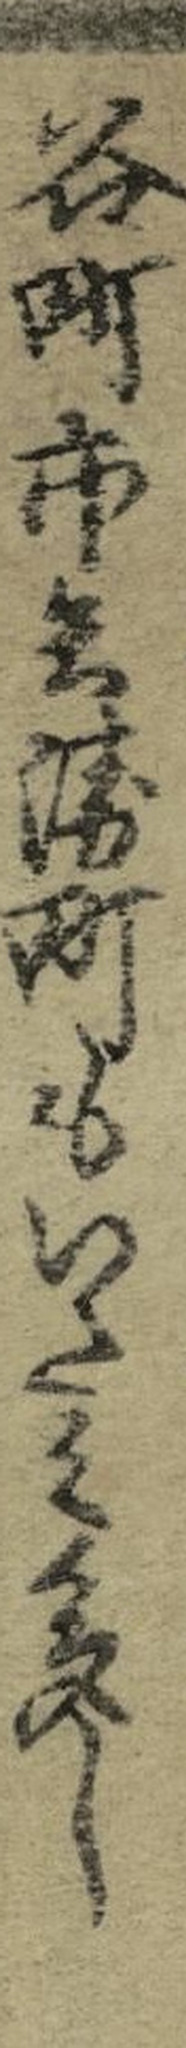谷町市兵衛町もいたみ多し
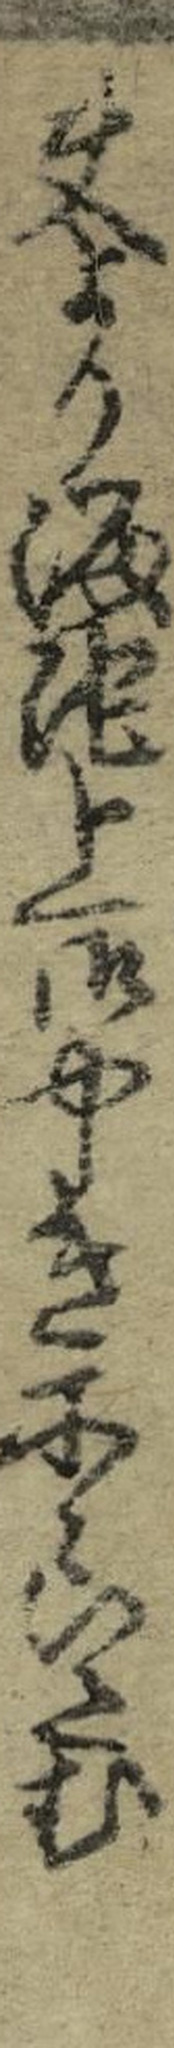夫より溜池上御やしき所々いたむ
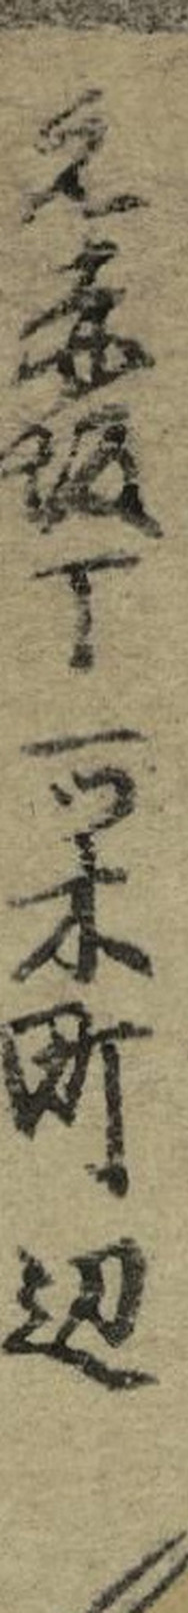元赤坂丁一ッ木丁辺
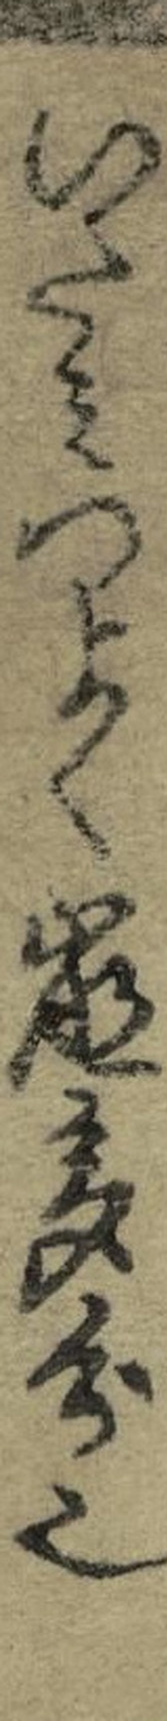いたみつよく崩多分也
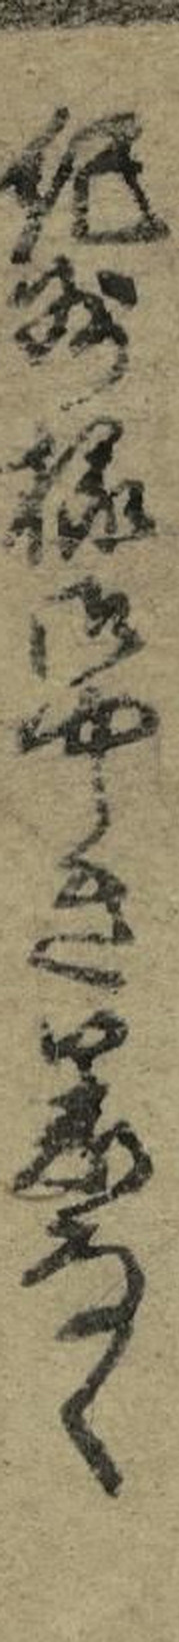肥前様御やしき恙なく
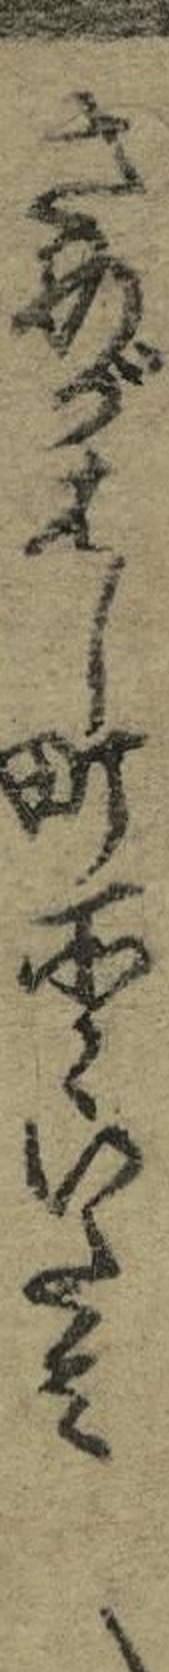さめがばし町所々いたみ
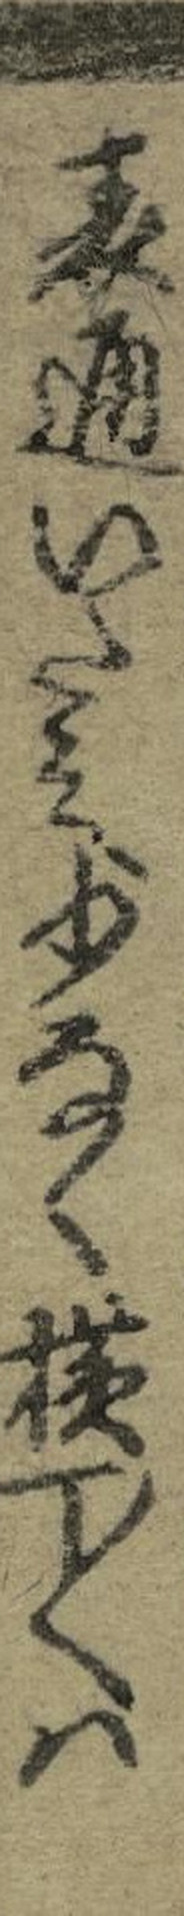表通いたみ少なく横丁〳〵は
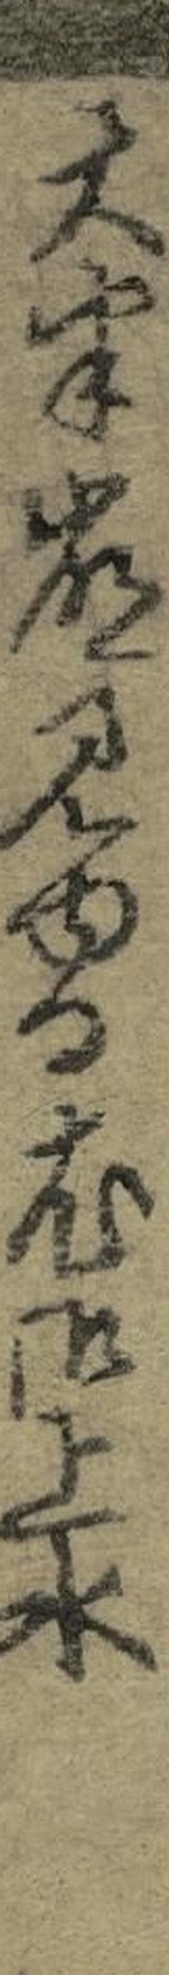大半崩見ゆる尤御上水
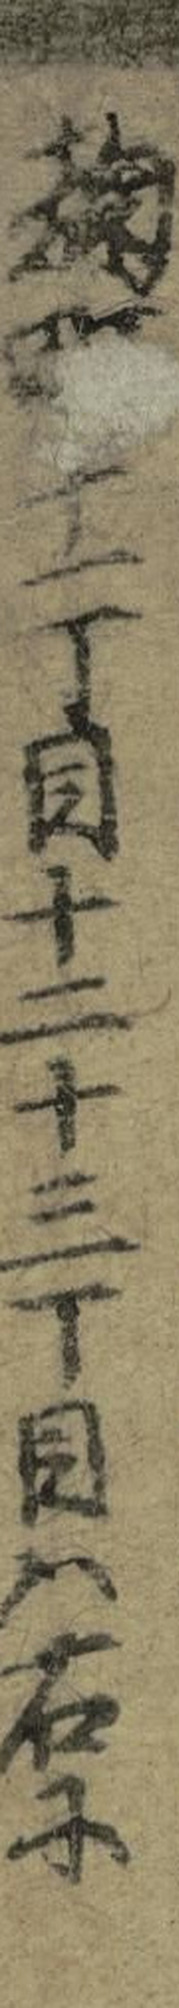麹町十一丁目十二十三丁目は右に
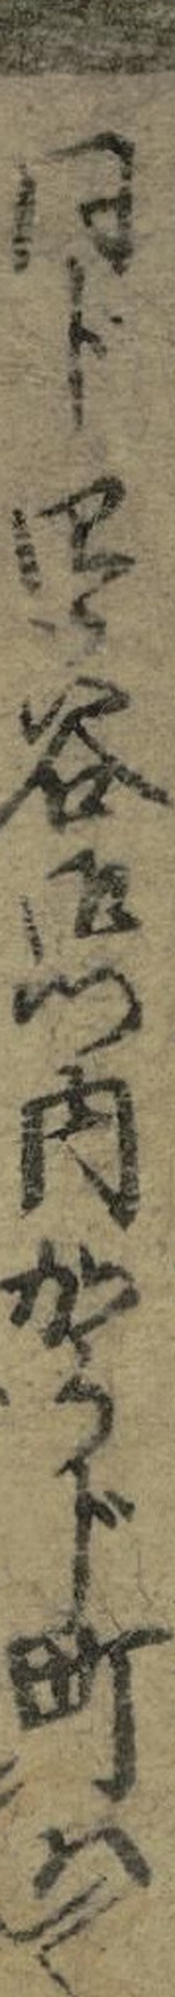同じ四ッ谷御門内かうじ町は
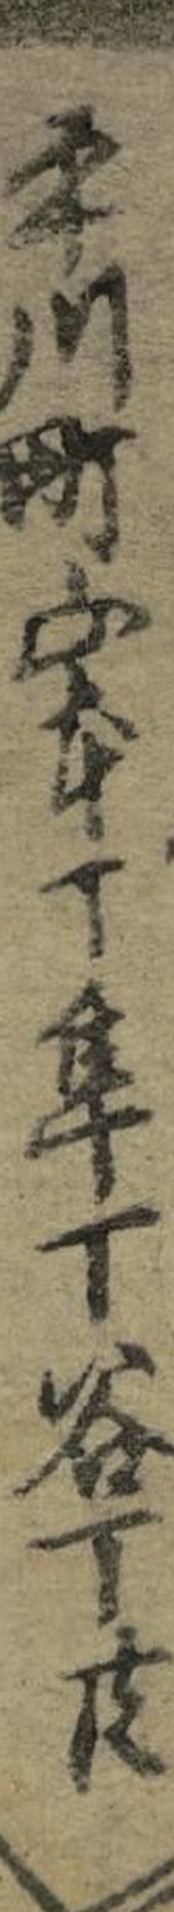平川町山本丁隼丁谷丁共
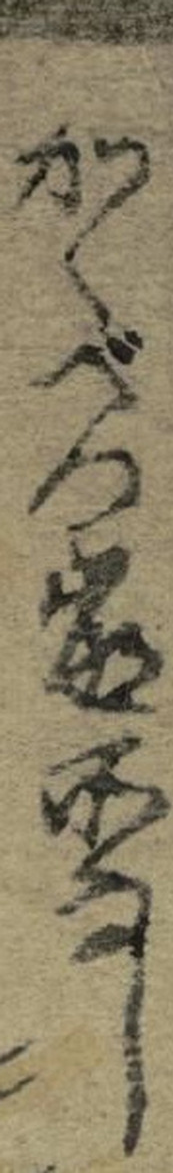かくべつ崩所なし
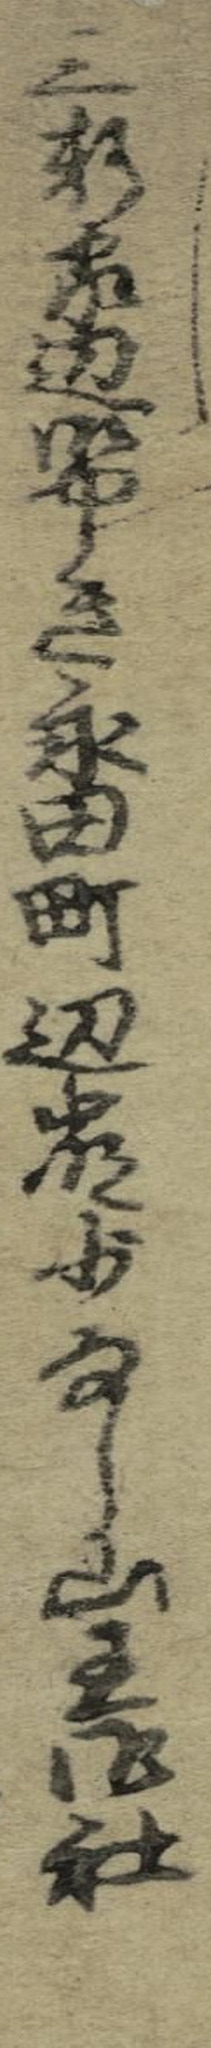三軒家辺御やしき永田町辺崩少なし山王御社
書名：安政二卯十月二日大地震附類焼場所
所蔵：東京大学地震研究所図書室 Earthquake Research Institute Library, The University of Tokyo, JAPAN
